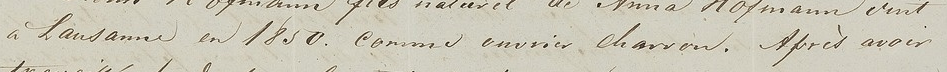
à Lausanne en 1850 comme ouvrier charron. Après avoir
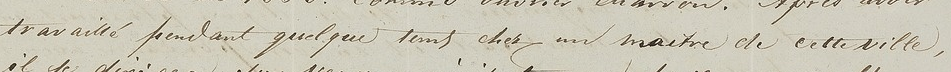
travaillé pendant quelque tems chez un maître de cette ville,
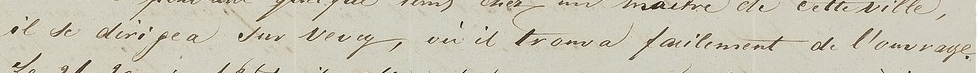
il se dirigea sur Vevey, où il trouva facilement de l'ouvrage.
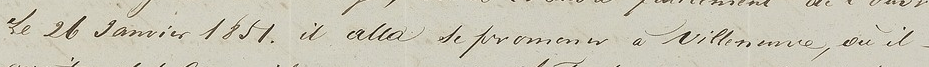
Le 26 janvier 1851 il alla se promener à Villeneuve, où il
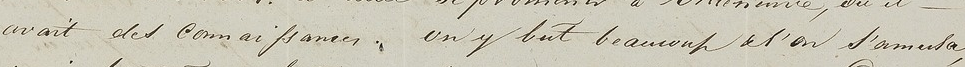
avait des connaissances. On y but beaucoup & l'on s'amusa,
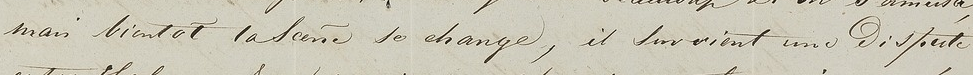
mais bientôt la scène se change, il survient un dispute
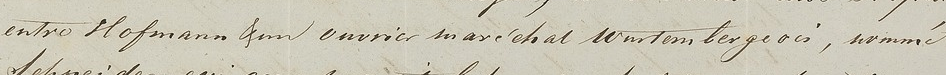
entre Hofmann & un ouvrier maréchal wurtembergois, nommé
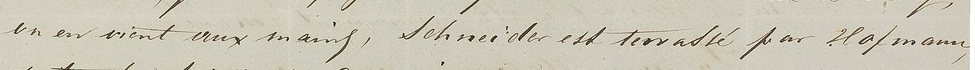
on en vient aux mains, Schneider est terrassé par Hofmann,
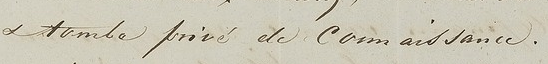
& tomba privé de connaissance.
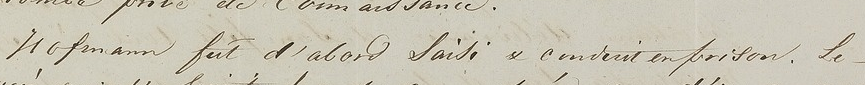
Hofmann fut d'abord saisie & conduit en prison. Le
